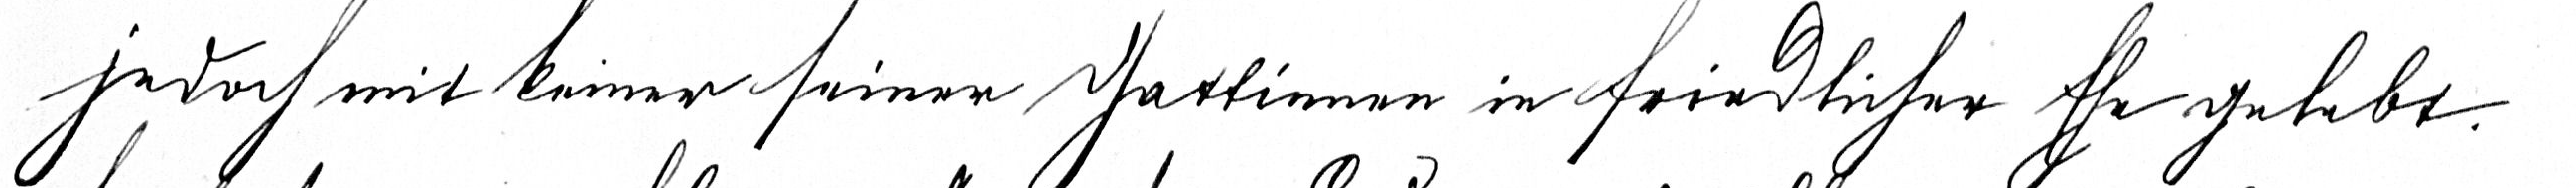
jedoch mit keiner seiner Gattinnen in Friedlicher Ehe gelebt.
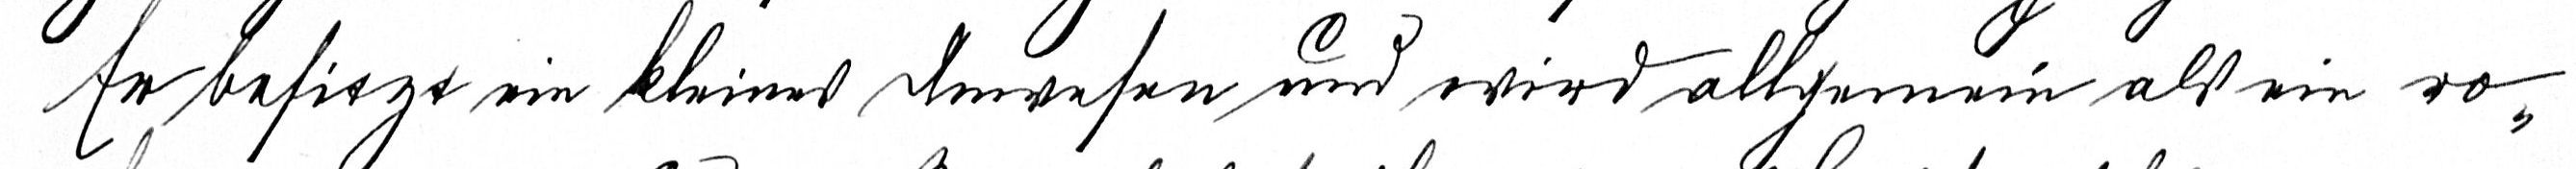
Er besitzt ein kleines Anwesen und wird allgemein als ein ro¬
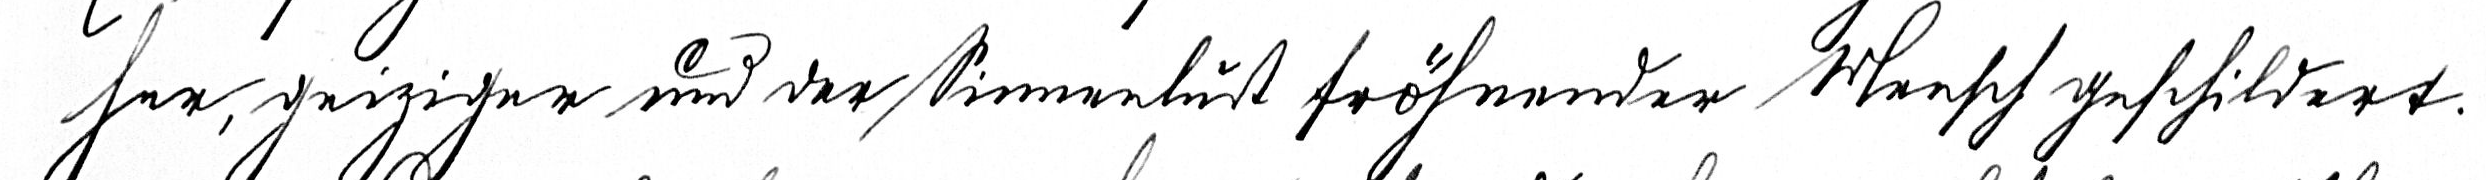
her, geiziger und der Sinnenlust fröhnender Mensch geschildert.
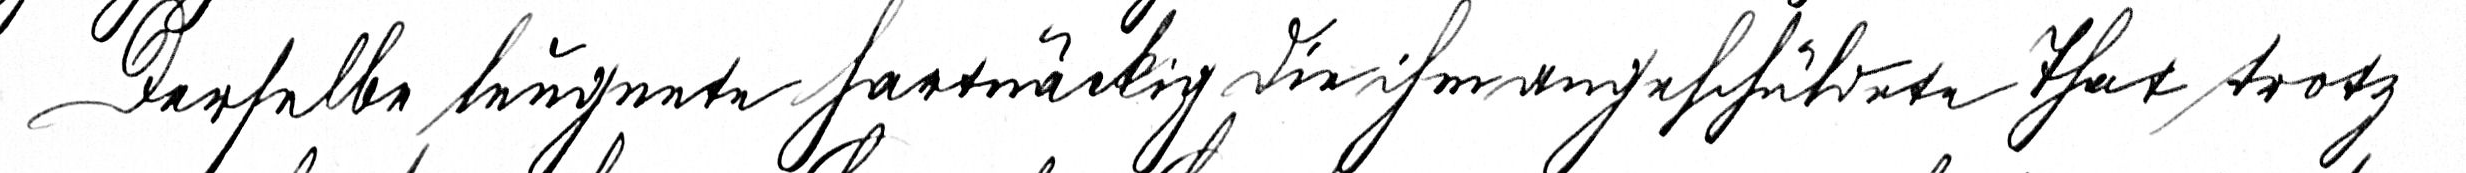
Derselbe leugnete Hartnäckig die ihm angeschuldete That trotz
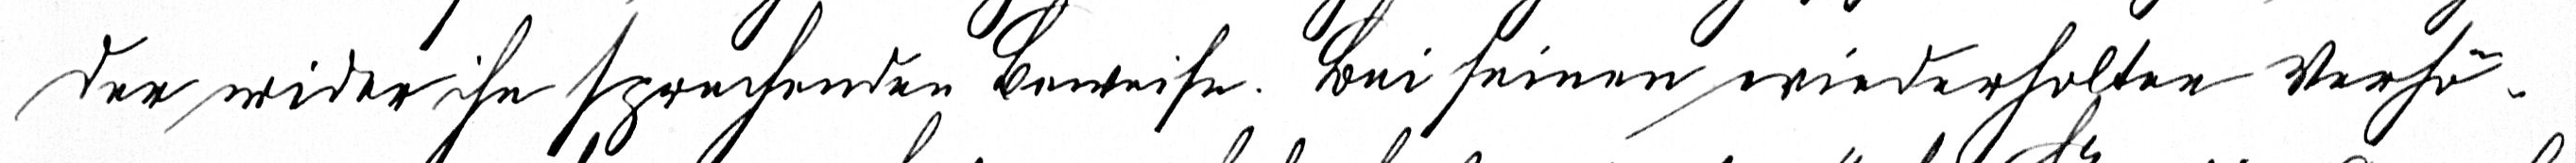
der wider ihn sprechenden Beweise. Bei seinen wiederholten verhö¬
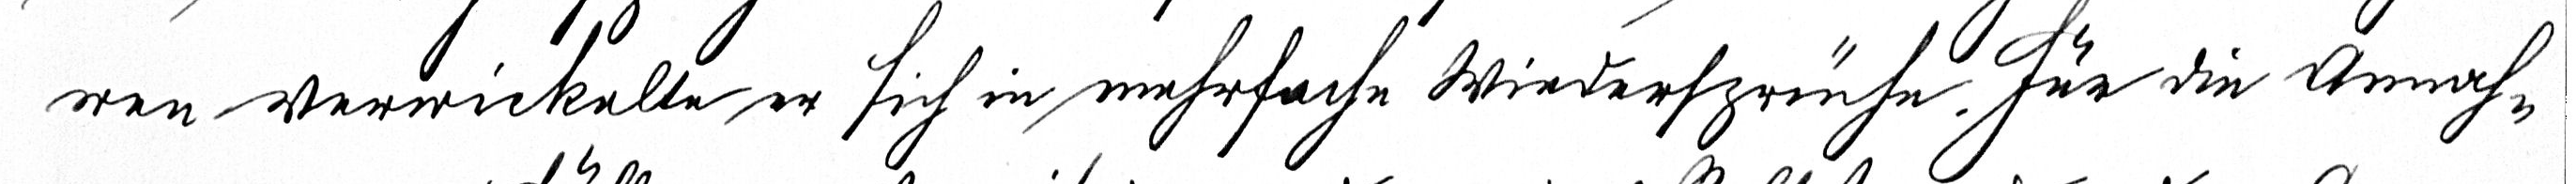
ren verwickelte er sich in mehrfache Wiedersprühe. Für die Annah¬
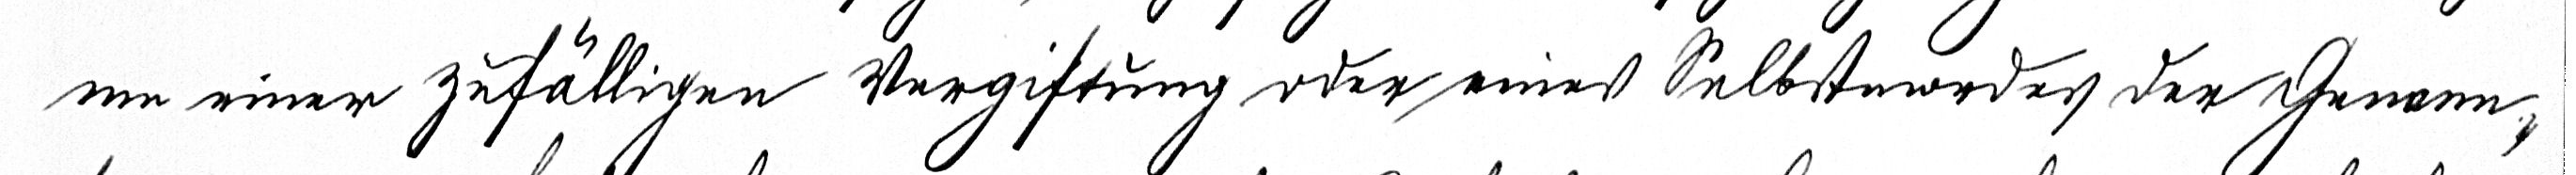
me einer zufälligen Vergiftung oder eines Selbstxxdes der Genann¬
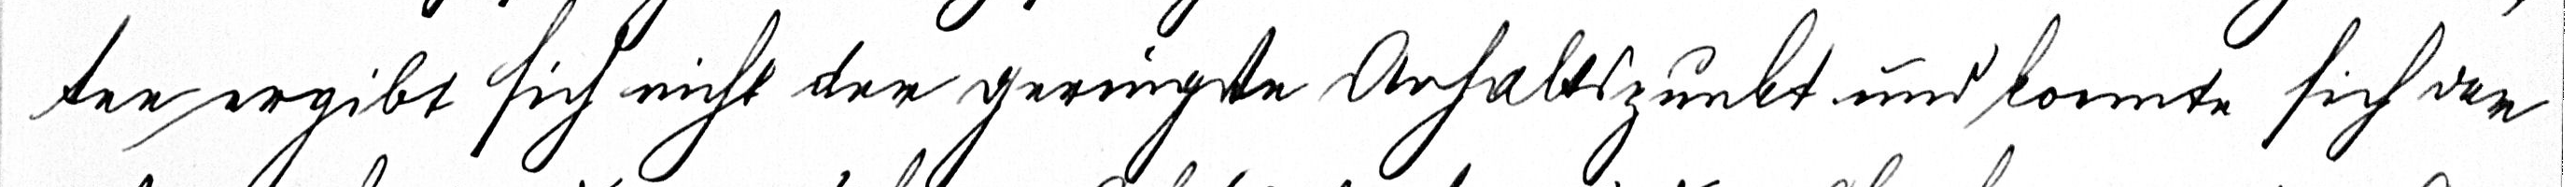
ten ergibt sich nicht der geringste Anhaltspunkt und formte sich der
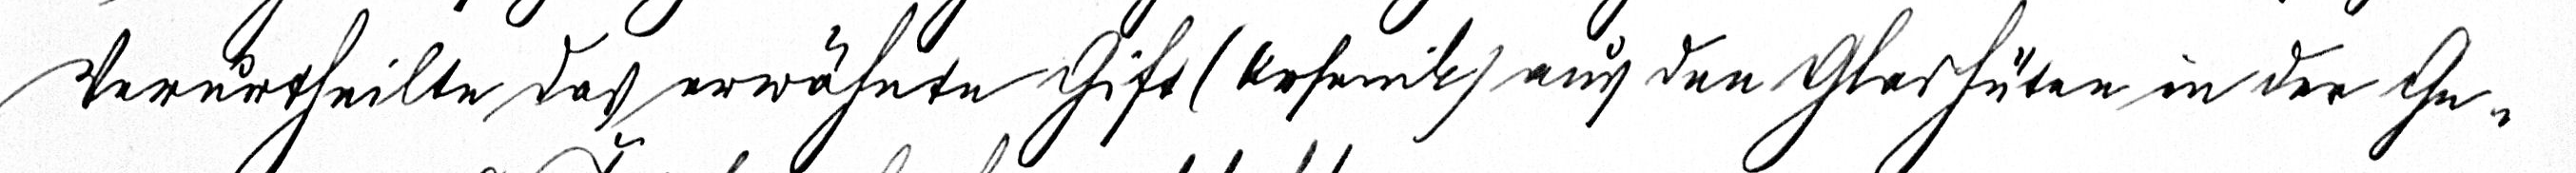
Verurtheilte das erwähnte Gift (Krxx) aus den Glashüten in der Ge¬
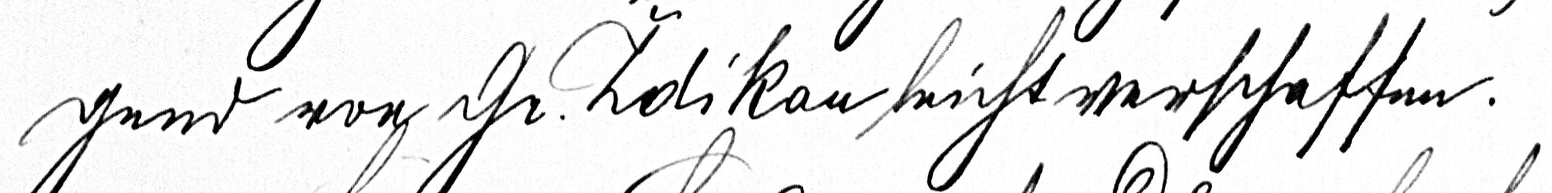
gend von Gr. Zdikau leicht verschaffen.
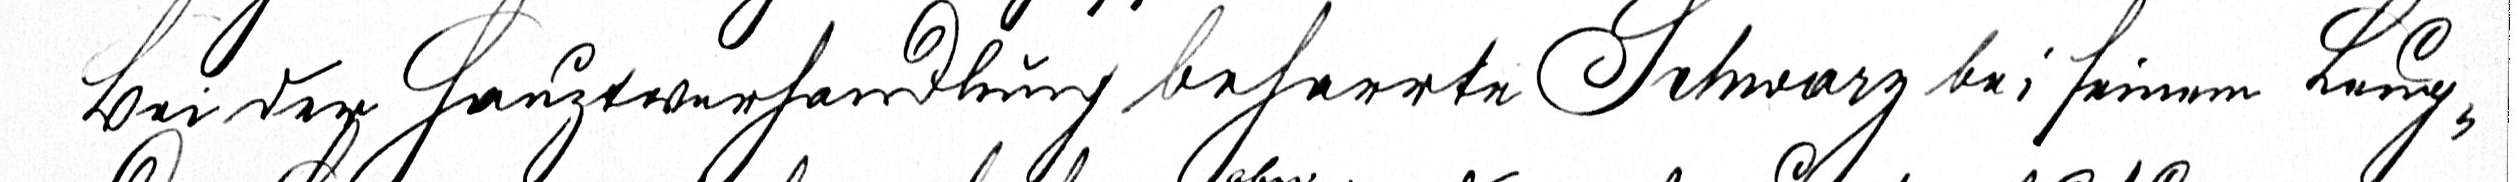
Bei der Hauptverhandlung beharrte Schwarz bei seinem Leug¬
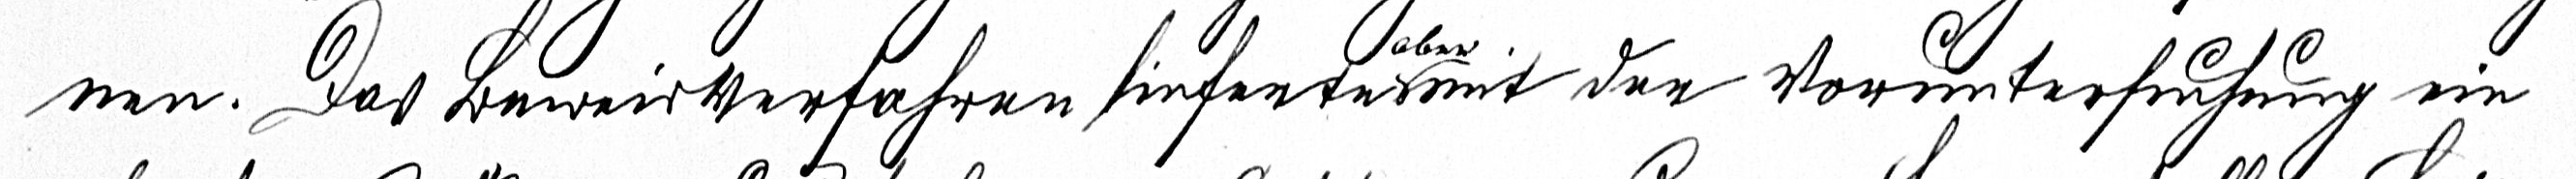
nen. Das Beweisverfahren xxfente aber mit den Vorunterfruhung ein
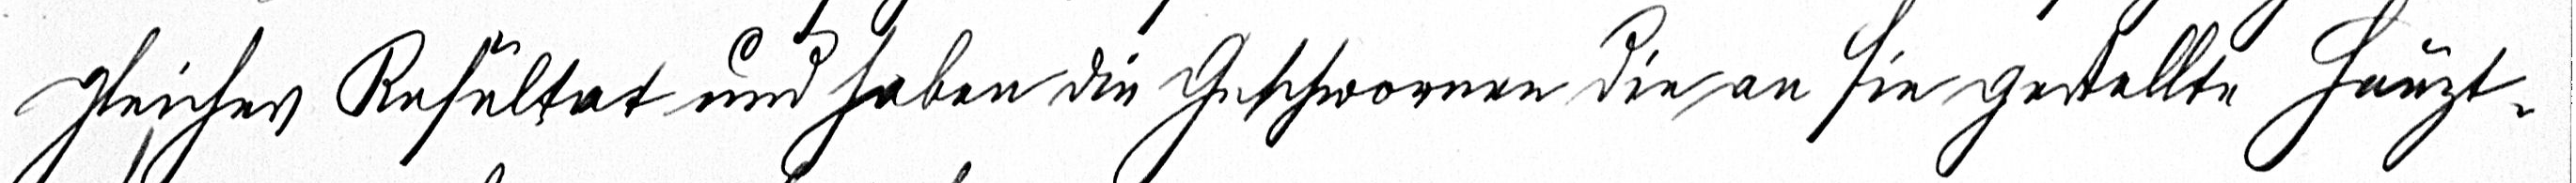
gleiches Resultat und haben die Geschwornen die an sie gestellte Haupt¬
